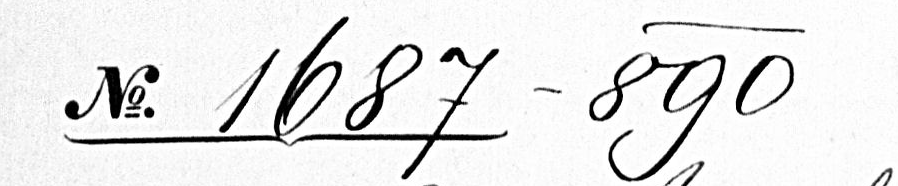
N° 1687-890
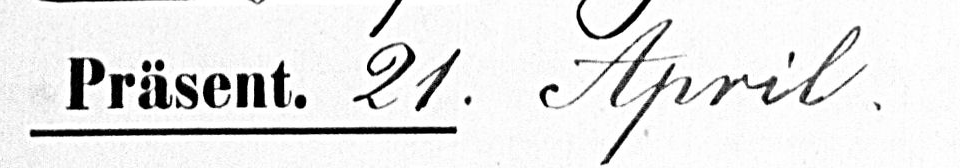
Präsent. 21. April.
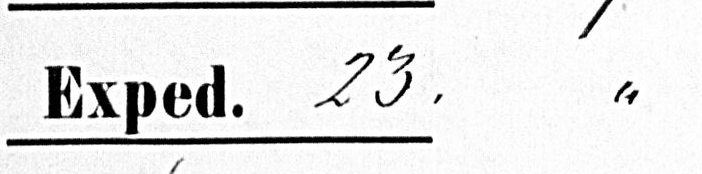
Exped. 23. April.
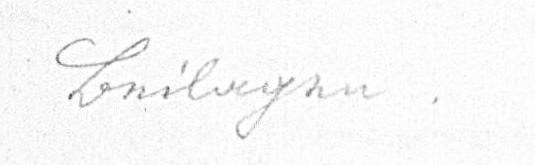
Beilagen.
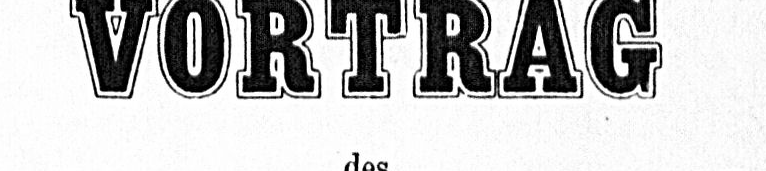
VORTRAG
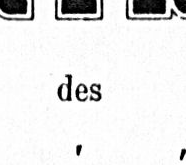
des
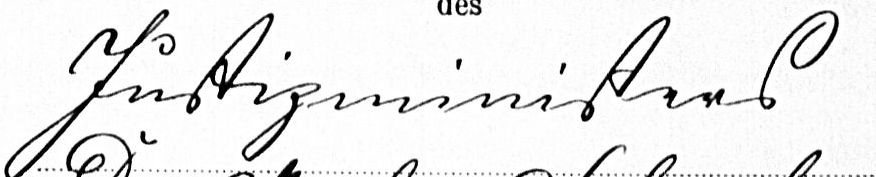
Justizministers
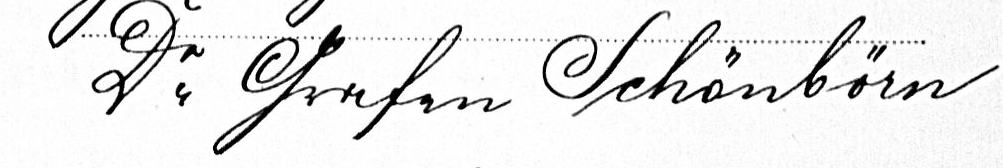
Dr. Graham Schönbörn
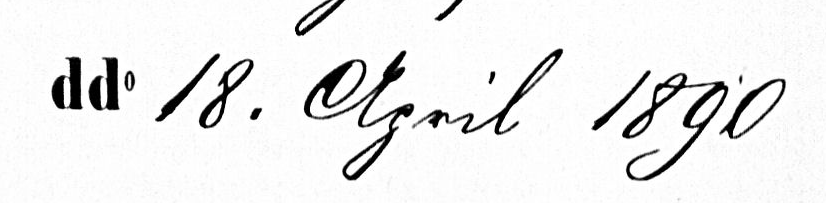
dd° 18. April 1890
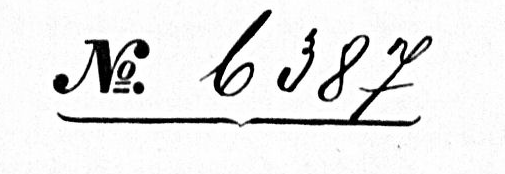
N° 6387
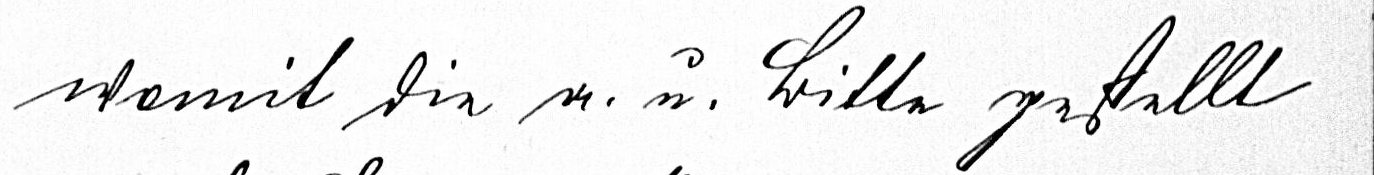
womit die a. u. Bitte gestellt
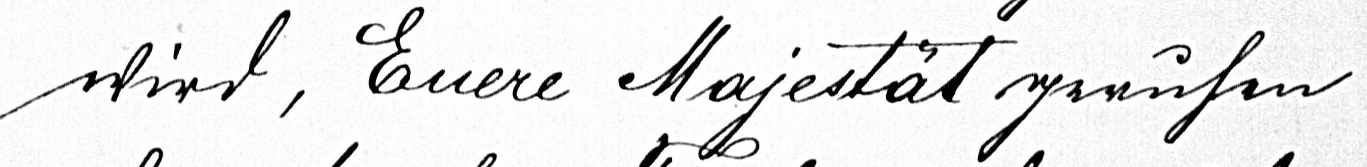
wird, Euere Majestät geruhen
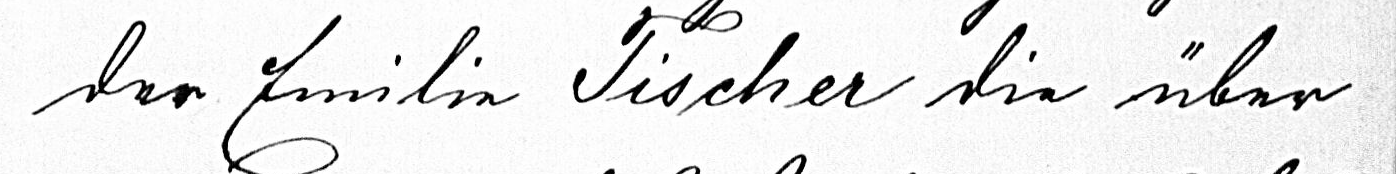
der Emilie Tischer die über
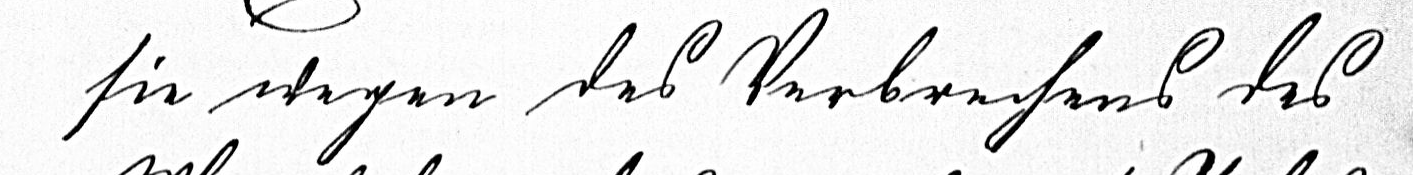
sie wegen des Verbrechens des
